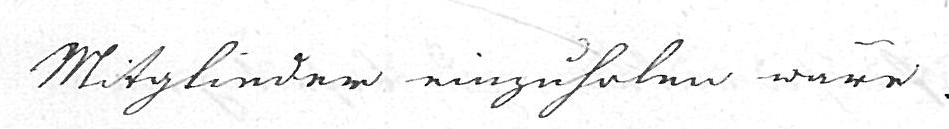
Mitglieder einzuholen wäre.
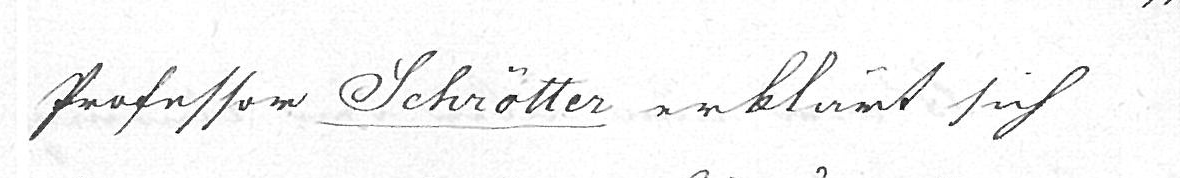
Professor Schrötter erklärt sich
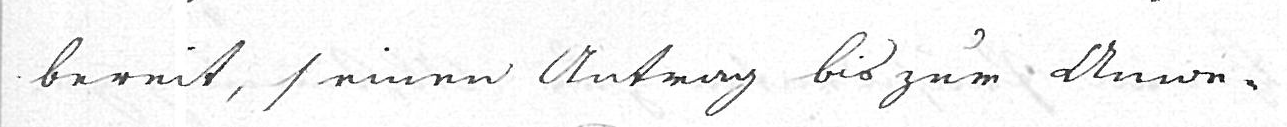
bereit, seinen Antrag bis zur Anwe-
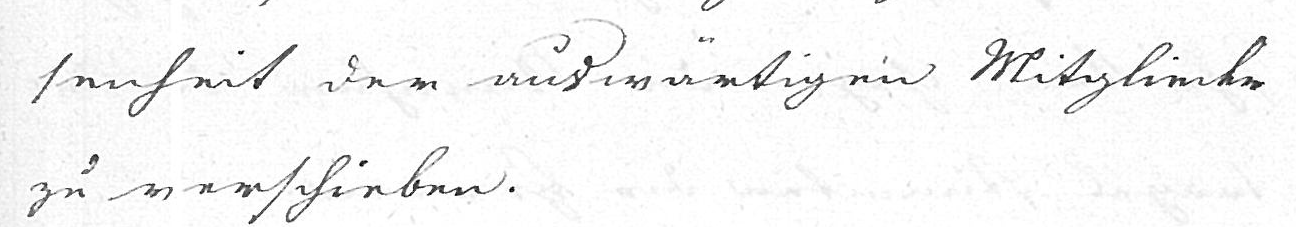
senheit der auswärtigen Mitglieder
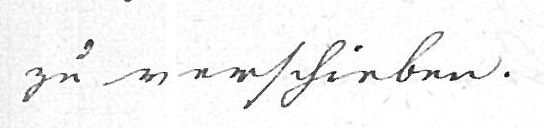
zu verschieben.
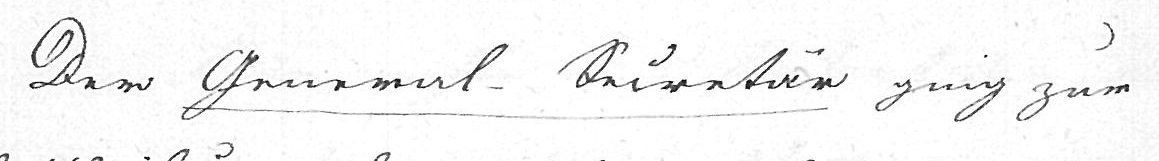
Der General-Secretär ging zur
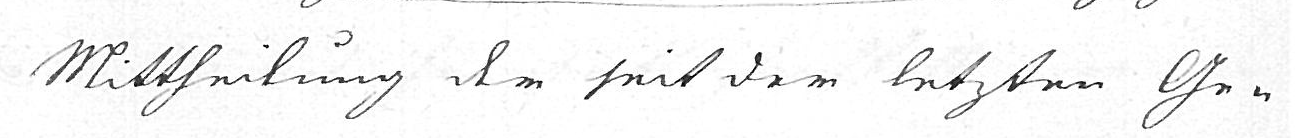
Mittheilung der seit der letzten Ge-
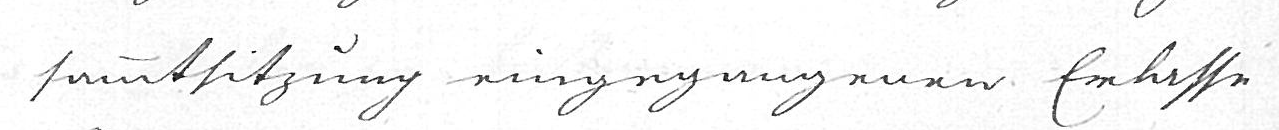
sammtsitzung eingegangenen Erlasse
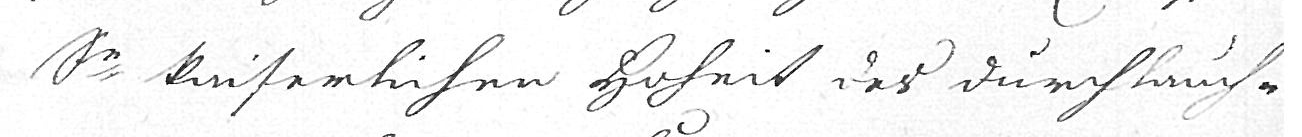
Sr. kaiserlichen Hoheit des durchlauch-
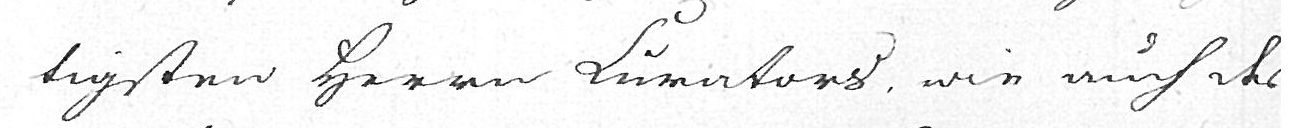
tigsten Herrn Curators, wie auch des
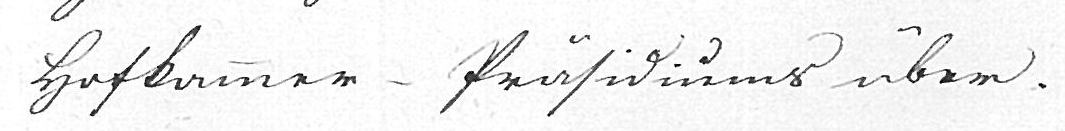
Hofkammer-Präsidiums über.
